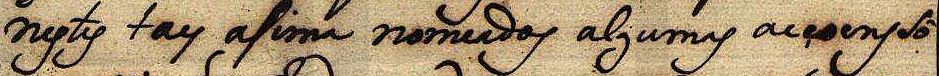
nestes taes asima nomeados algumas acçoens só
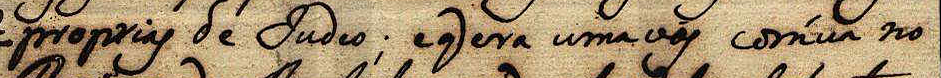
proprias de Iudeo; e q̄ era uma vós comúm no
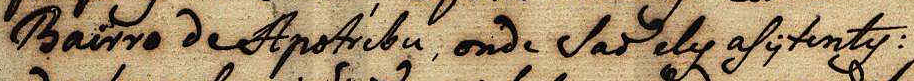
Bairro de Apotrebu, onde Saõ eles asistentes:
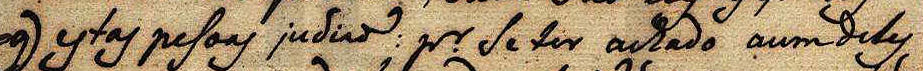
q̄ estas pesoas judias: por se ter achado a um deles
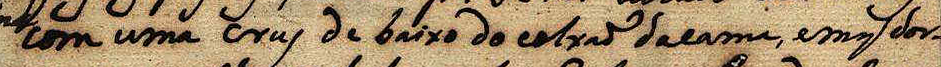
com uma crus debaixo do colxaõ da cama, em q̄ dor
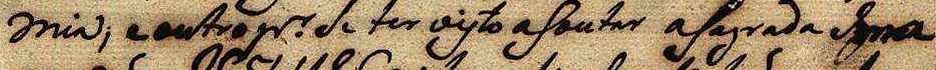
mia; e outro pr. se ter visto asoutar a sagrada Ima
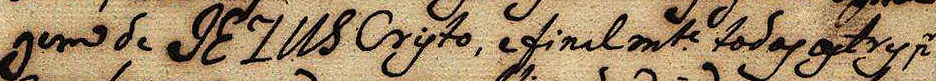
gem de IEZUS Cristo, e finalm.te todos os tres p.r
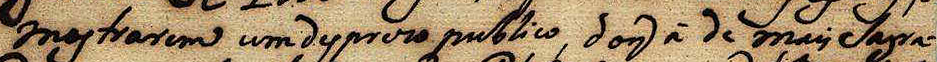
mostrarem um desprezo publico do q̄ á de mais Sagra
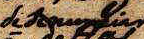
de denunciar
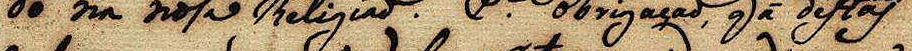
do na nosa Religiaõ. P.la obrigaçaõ, q̄ á destas
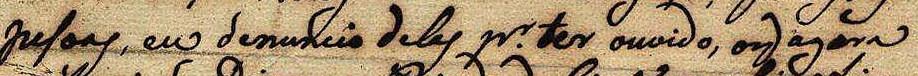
pesoas, eu denuncio delas p.r ter ouvido, o q̄ agora
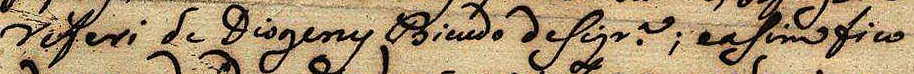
referi de Diogenes Bicudo de Siqr.a; e asim fico
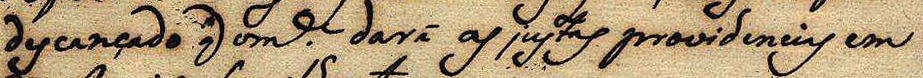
descançado q̄ v m.e dará as justas providencias em
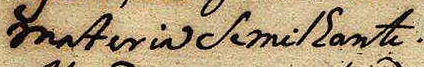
materia Semilhante.
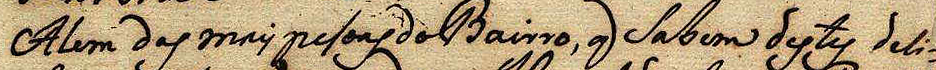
Alem das mais pesoas do Bairro, q̄ sabem destes deli
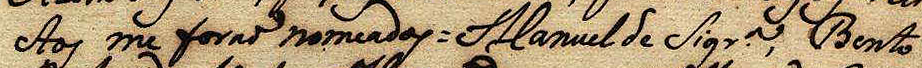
tos me foraõ nomeados = Manuel de Siqr.a, Bento
